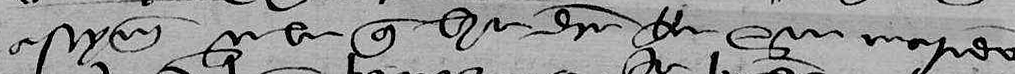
asym sabe q̄ ha dīa Ree e seu marido
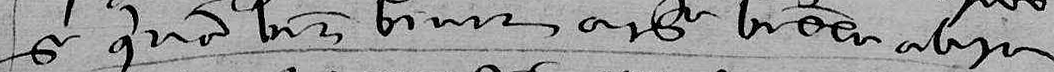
se qiriā vir viuer a esta villa avera
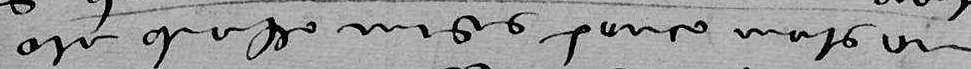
ora quatro meses pouco majs ou
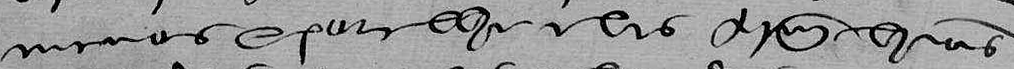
menos e por lhe eles terem huās
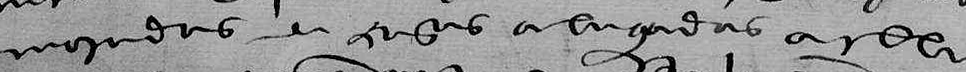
moradas de casas alugadas a elle
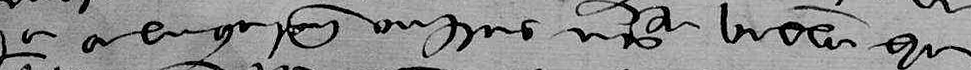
ta alugaram outras nesta villa ha
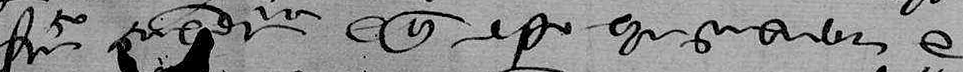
frrco caldrra e q̄ desto he sabedor e
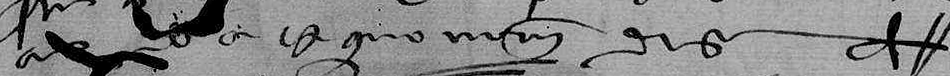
al do artiguo nam dise
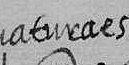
naturaes
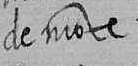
de mōte
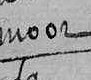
moor
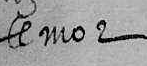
temor
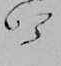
63
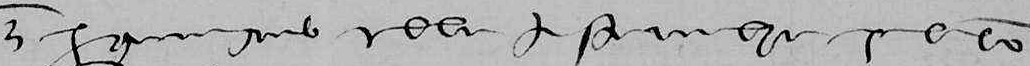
item ꝑgumtado elle testemunha pllō
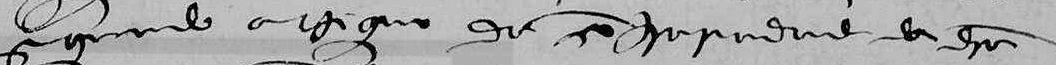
segundo artiguo da c̄otrariadade da dīa
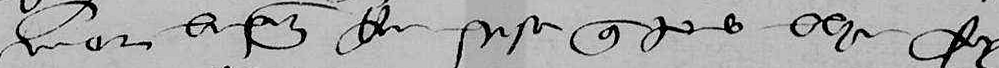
mor lopez Ree presa q̄ todo lhe foy
